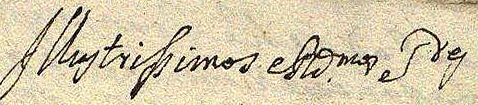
Jllustrissimos e Rev.mos S.res
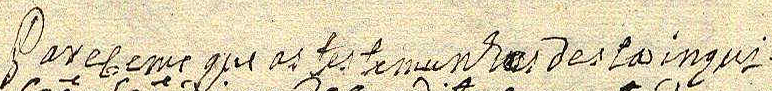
Pareceme que as testemunhas desta inqui
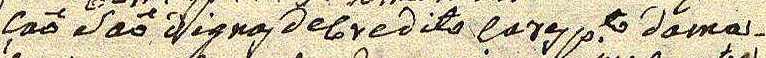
çaõ saõ dignas de credito e a resp.to da ma
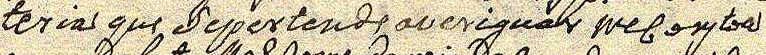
teria que se pertende averiguar me Constou
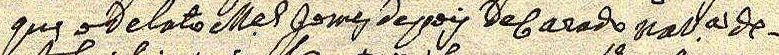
que o Delato M.el Gomes depois de Cazado na V.a de
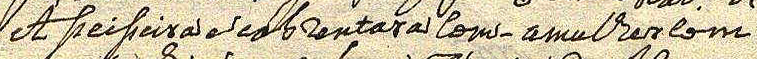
Asseisseira se abzentara com a mulher com
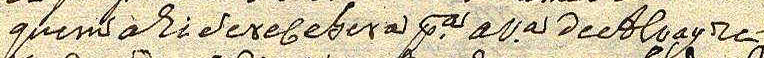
quem ahi se reCebera pa a v.a de Alvayze
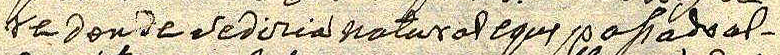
re donde se dizia natural e que passado al
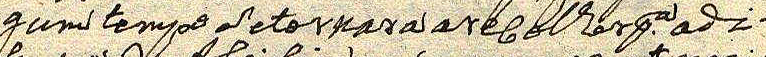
gum tempo se tornara a recolher p.a a di
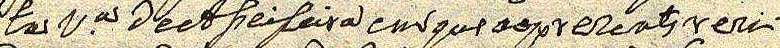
ta V.a de Asseisseira em que ao prezente rezi
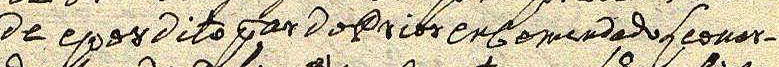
de e por dito por do Prior encomendado Leonar
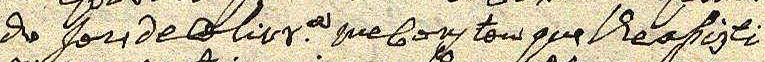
do Jose de Olivr.a me Constou que lhe assisti
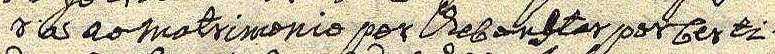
ra ao matrimonio por lhe constar por certi
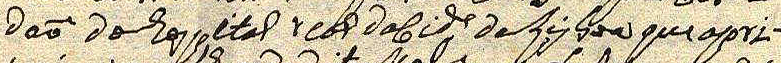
daõ do Hospital real da Cid.e de Lisboa que a pri
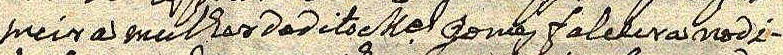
meira mulher do dito M.el Gomes falecera no di
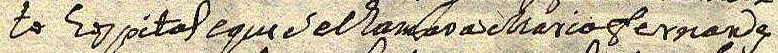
to Hospital e que se chamava Mario Fernanda
